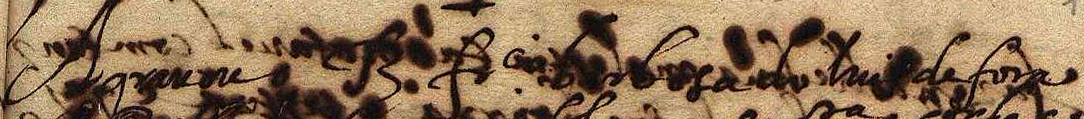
Agrauou o R frco barbosa do luis de fora
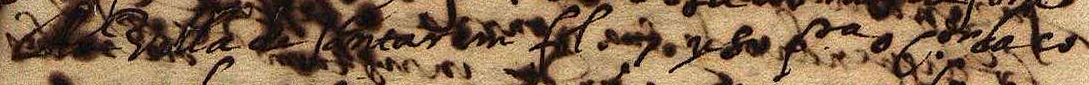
Na Villa de santarem fol. 7. uso p.ra o C.or da co
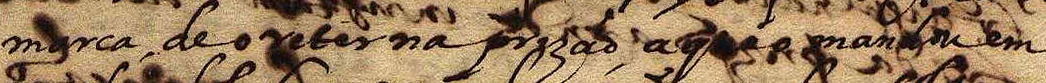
marca, de o reter na prizaõ, a que o mandou em
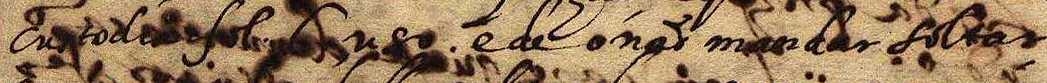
custodia fol. 6 uso. e de o naõ mandar soltar
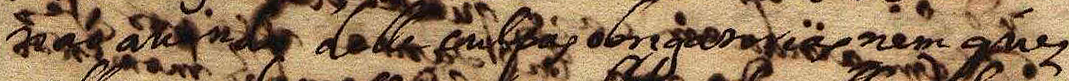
naõ auendo delle culpas obrigatorias nem que
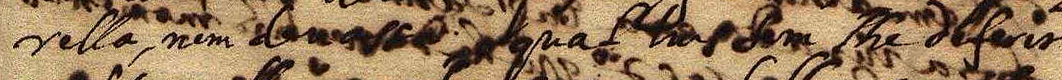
rella, nem deuassa a qual ha sem lhe deferir
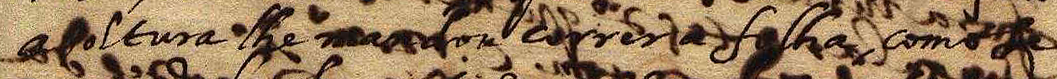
a soltura lhe mandou correr a folha, como se
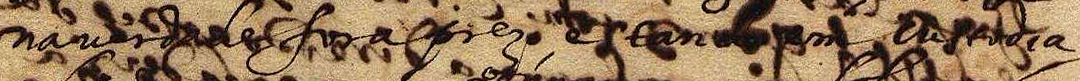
na uerdade fora prezo, estando em custodia
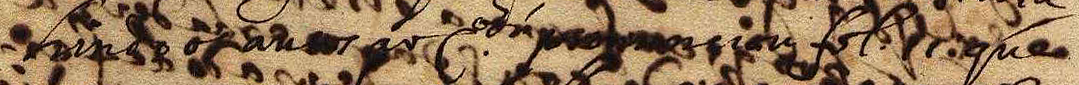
hindo os autos ao C.or pronunciou fol. 11 que
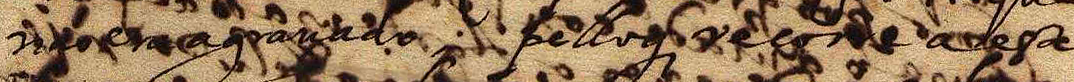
nao era agrauado; pello q recorre a este
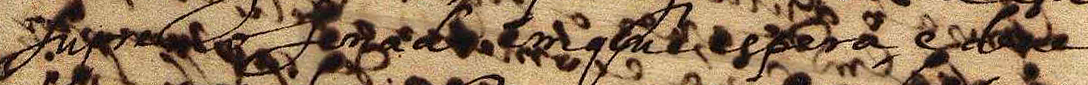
supremo senado em que espera, e deue
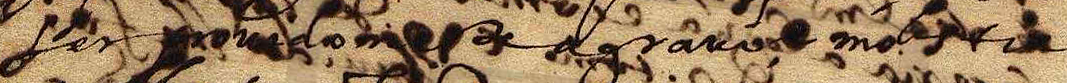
ser prouado neste agrauo molestia
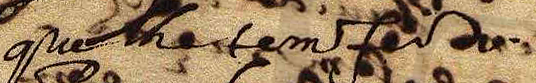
que lhe tem feito.
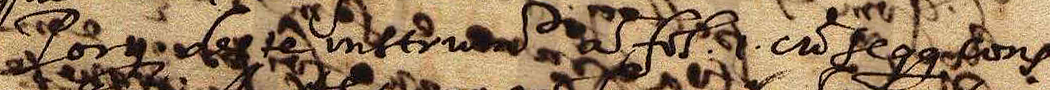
Porq. deste instrumto a fol. 1. cūseqq. cons
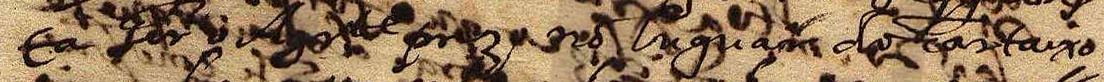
ta ser o Agrte prezo nō luguar do cartaixo
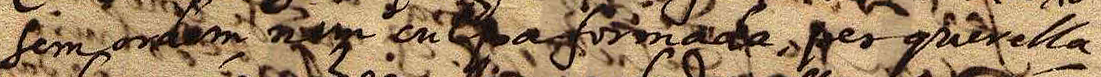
sem ordem nem culpa formada, per querella
